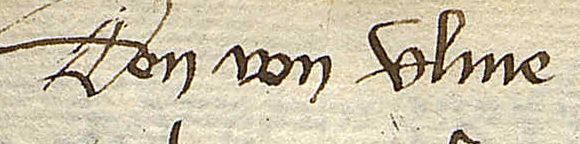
Den von Vlme
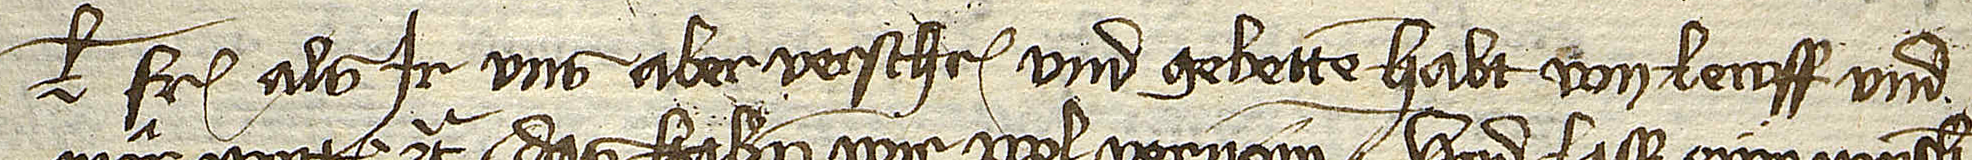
L* fr* als Ir vns aber verſchr* vnd gebette* habt von lewff vnd
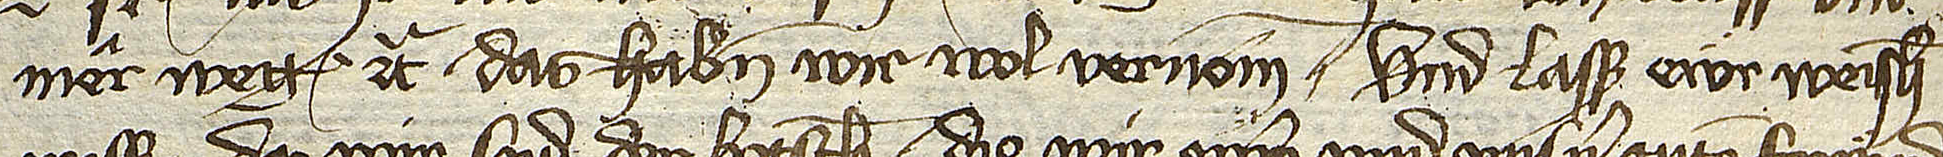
mër weg* ec* / das habn* wir wol vernom* / vnd laſſ* eẅr weiſh*
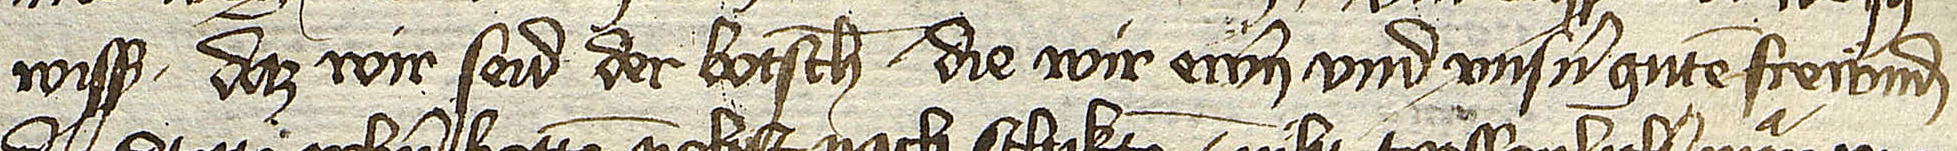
wiſſ* / daʒ wir ſeid der botſch* / die wir ew*n vnd vnſn* gute* freẅnd*
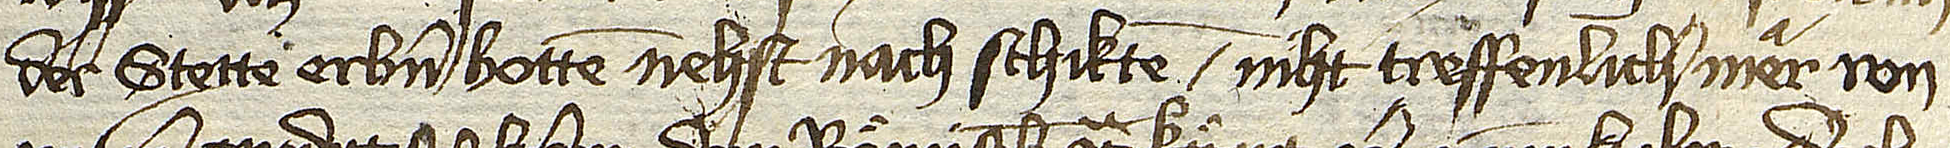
der Stette erbn* botte* nehſt nach ſchikte* / niht treffenlich* mër von
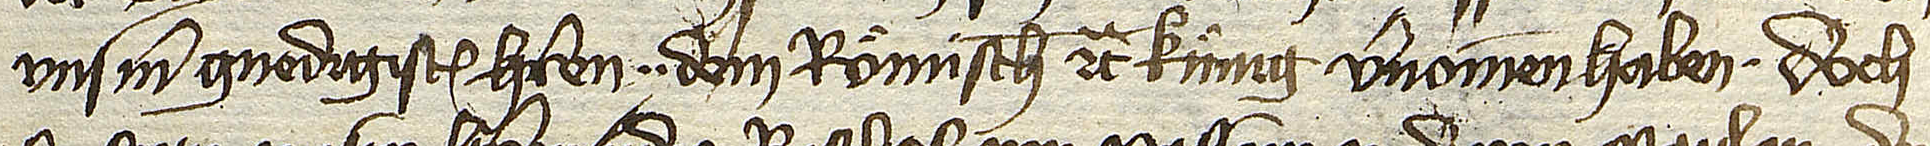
vnſm* gnedigiſt* hr*en ~ dem Römiſch* ec* künig v*nomen haben . Doch
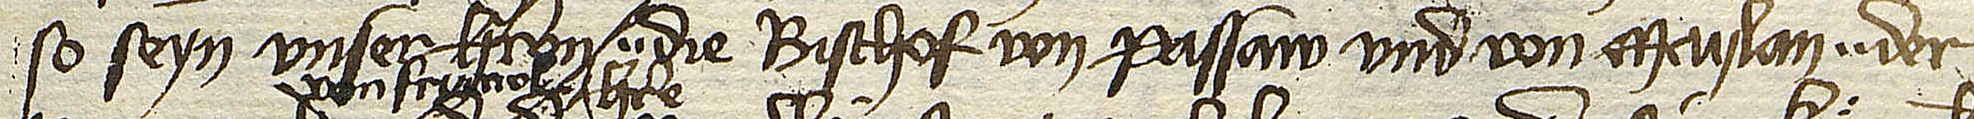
ſo ſeyn vnſer hr*en ~ die Biſchof von Paſſaw vnd von Maylan ~ der
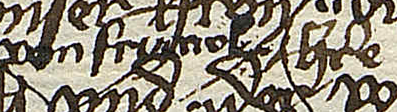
von fryawl hr*e
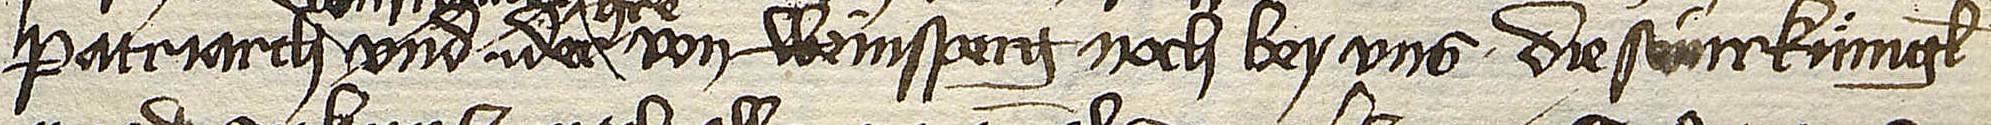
Patriarch vnd ~ der von weinſperg noch bey vns . Die ſeinr küngl*
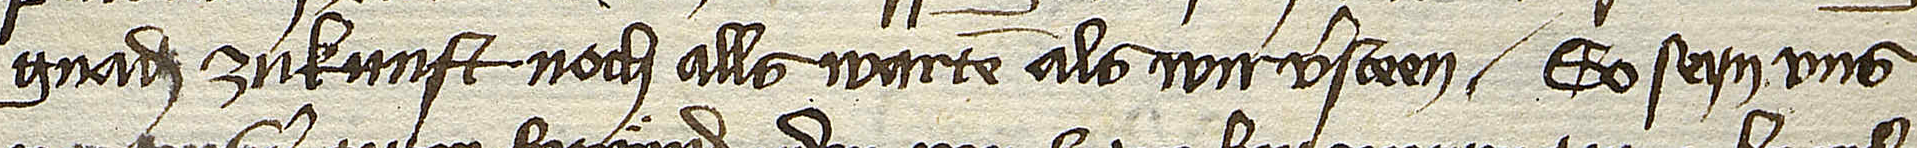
gnad* cʒukunft noch alls warte* als wir v*ſteen / So ſeyn vns
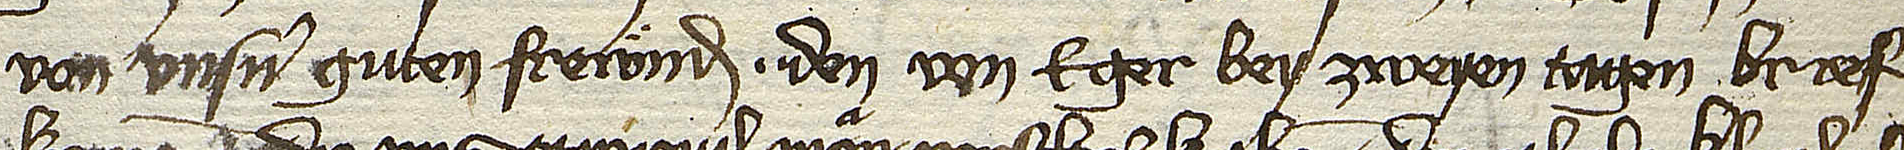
von vnſn* guten freẅnd* ~ den von Eger bey ʒweyen tagen brief
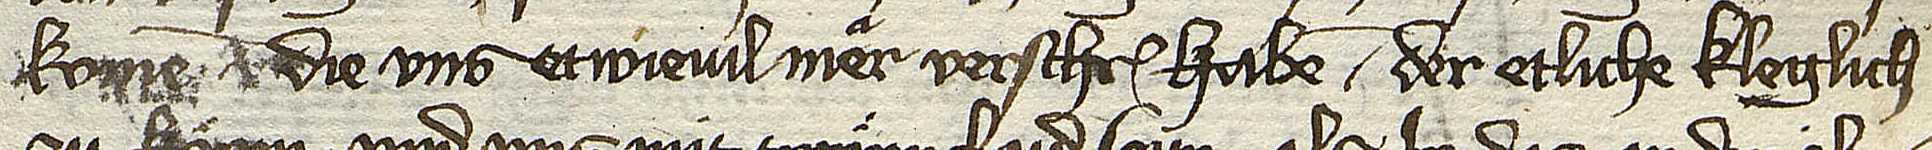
kome* / die vns etwieuil mër verſchr* habe* / der etliche kleglich
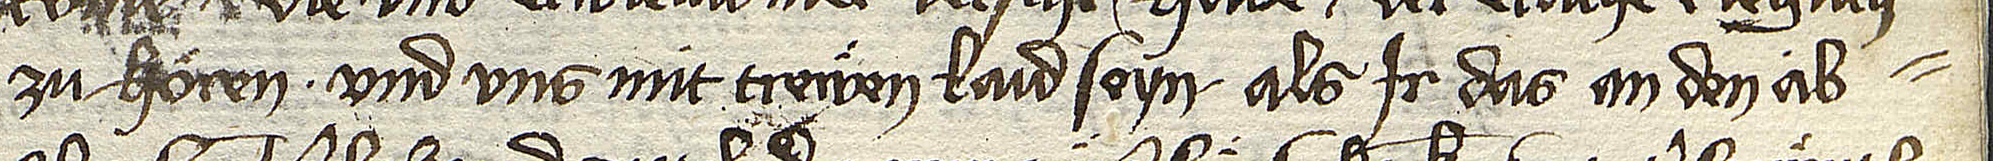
ʒu hören . vnd vns mit treẅen laid ſeyn / als Ir das an den ab =
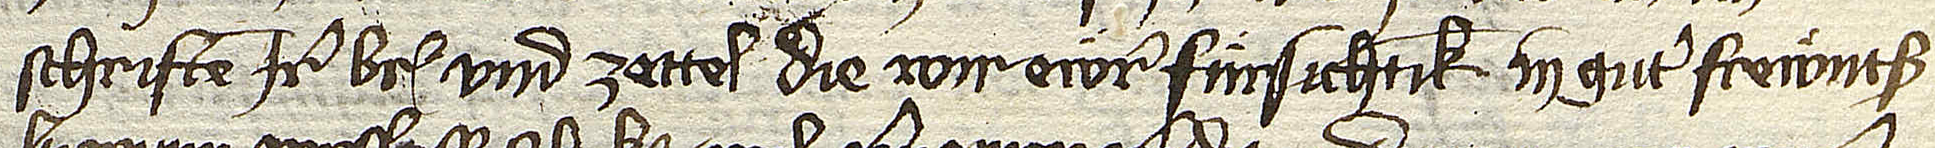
ſchrifte* Ir* br* vnd ʒettel die wir eẅr* fürſichtik* in gut* freẅtſ*
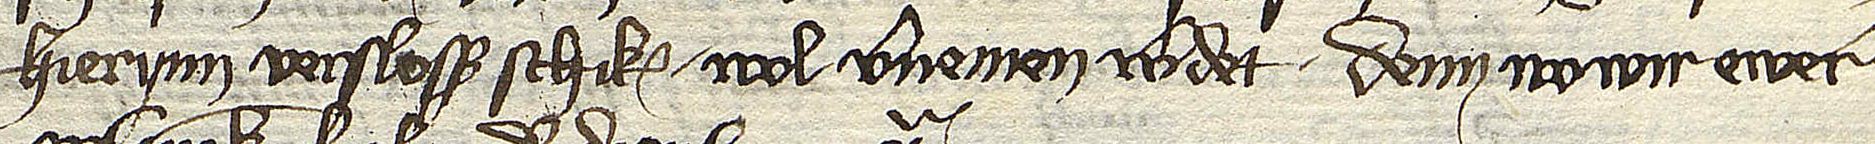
hierynn verſloſſ* ſchik* wol v*nemen w*det / Denn wo wir ewer*
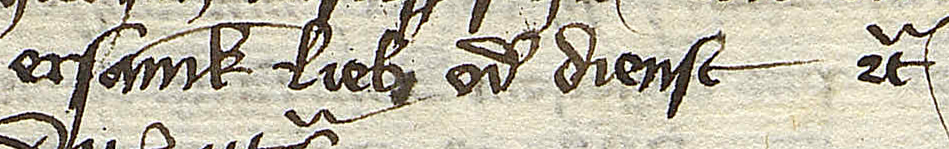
erſamk* lieb od* dienſt ec*
